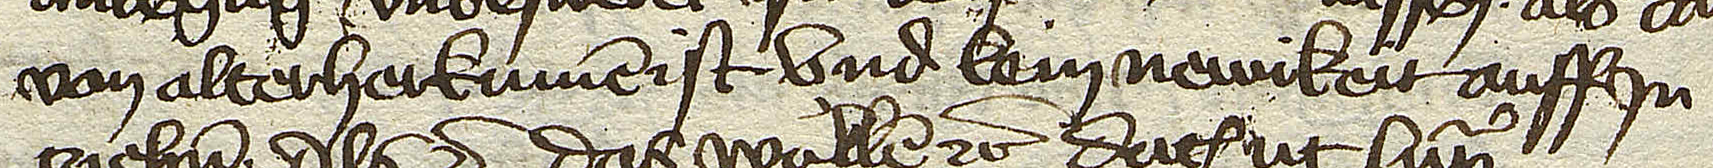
von alter herkumen* iſt Vnd kein newikeit auff In
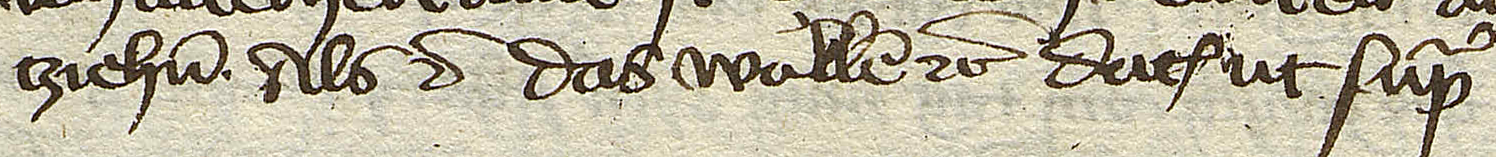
cʒieh*n . Als ec* das wölle ec* Dat* ut ſup*
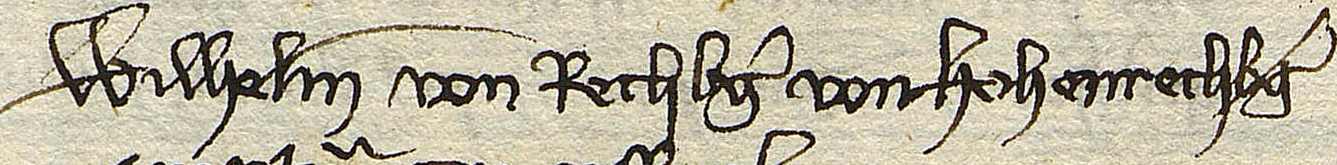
Wilhelm* von Rechb*g von hohenrechb*g
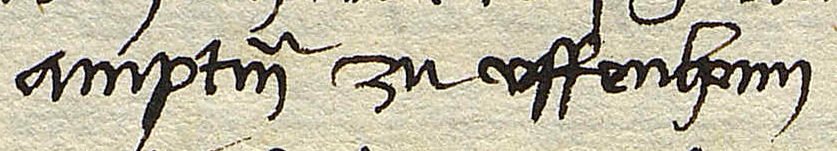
amptm* ʒu vffenheim
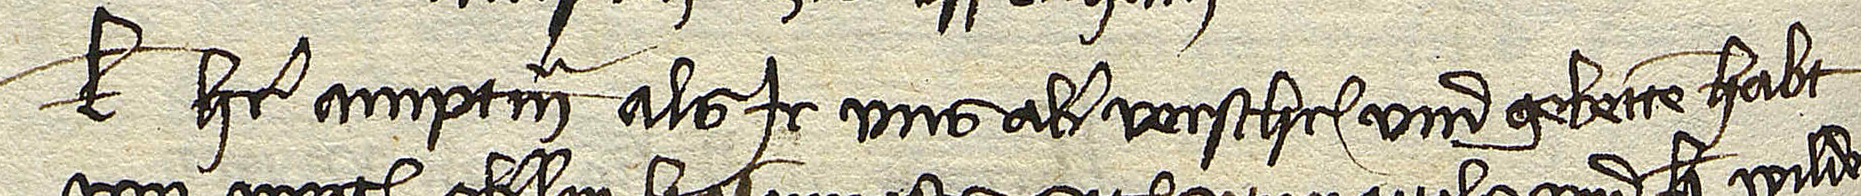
L* h*r amptm* als Ir vns ab* verſchr* vnd gebette* habt
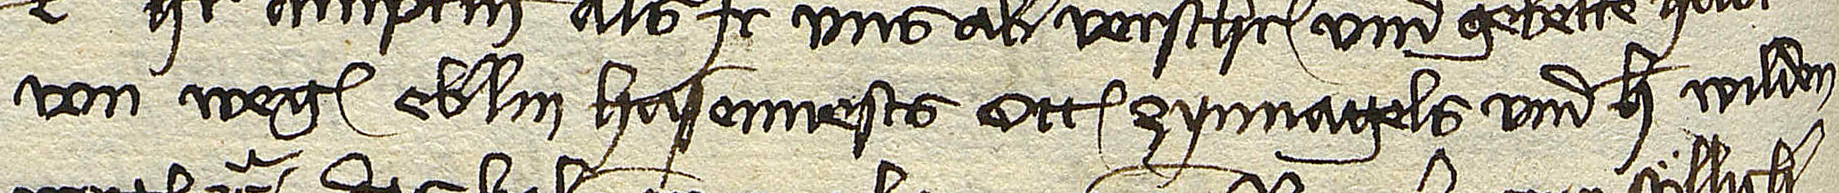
von weg* eb*lin haſenneſts Ott* ʒynnagels vnd h* wilden
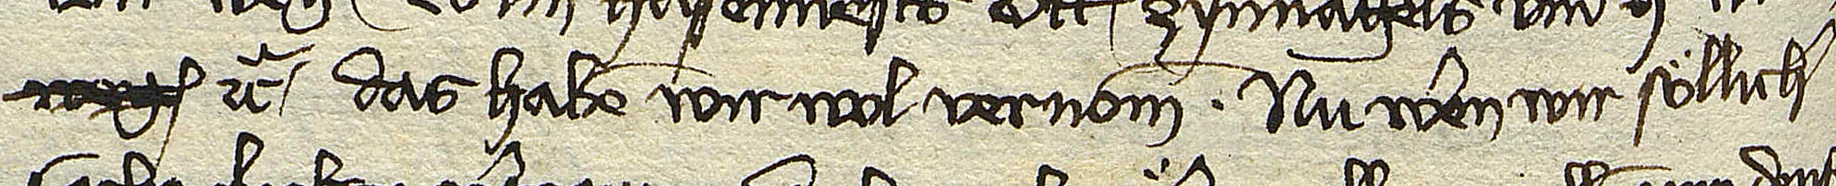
weg* ec* das habe* wir wol vernom* . Nu w*en wir ſöllich*
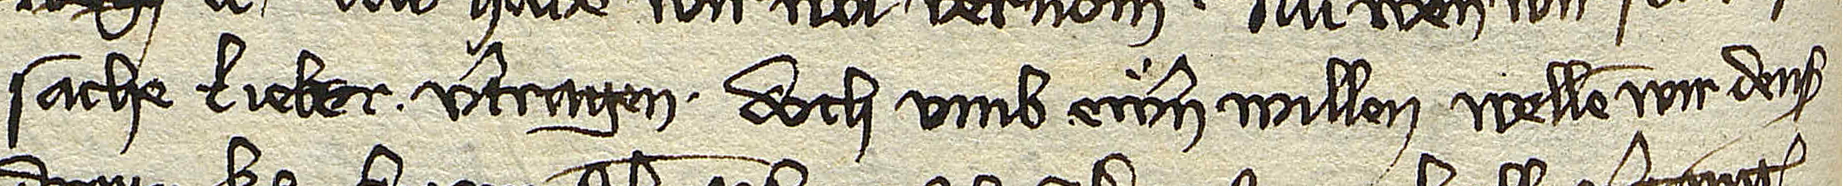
ſache lieber . v*tragen . Doch vmb eẅ*n willen welle* wir denſ*
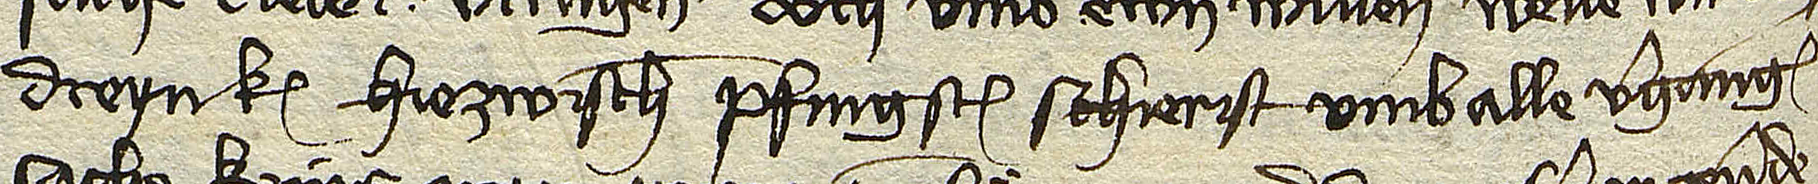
dreyn k* hieʒwiſch* pfingſt* ſchieriſt vmb alle v*gang*
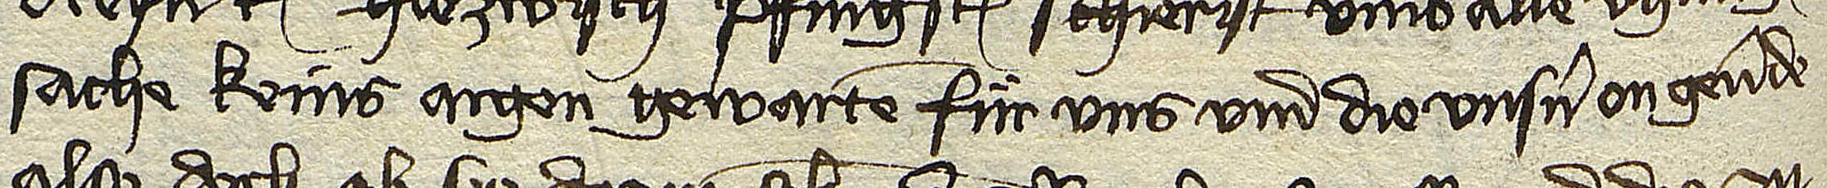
ſache keins argen gewarte* für vns vnd die vnſ*n on geu*de
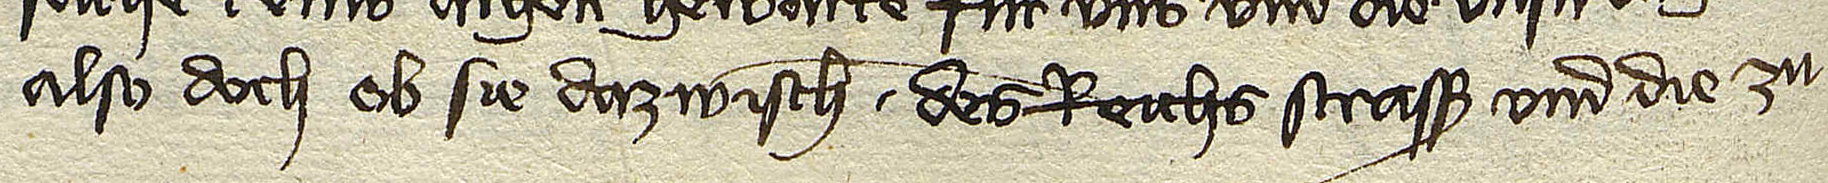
alſo doch ob ſie daʒwiſch* . das Reichs ſtraſſ* vnd die ʒu
